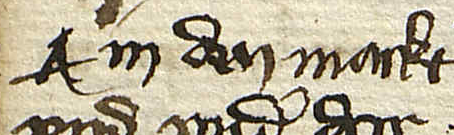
in den markt
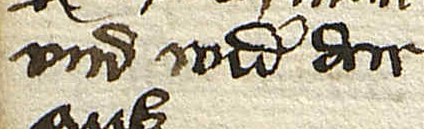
vnd wid* dar
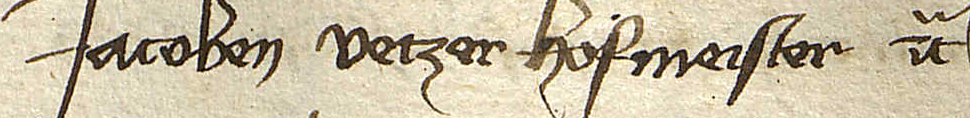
Iacoben Vecʒer hofmeiſter ec*
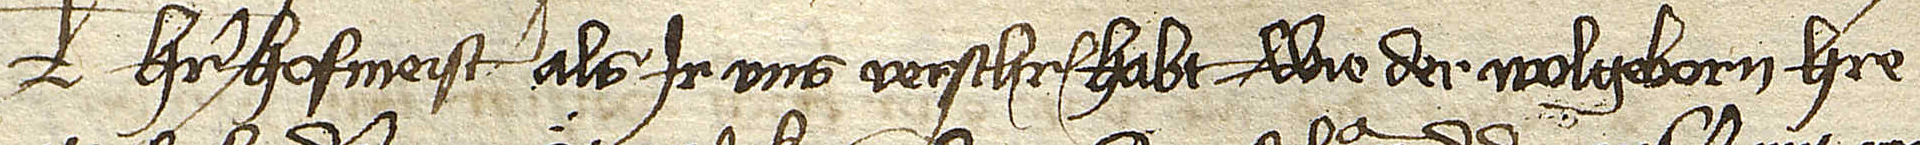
L* Hr* hofmeiſt* als Ir vns verſchr* habt / Wie der wolgeborn h*re
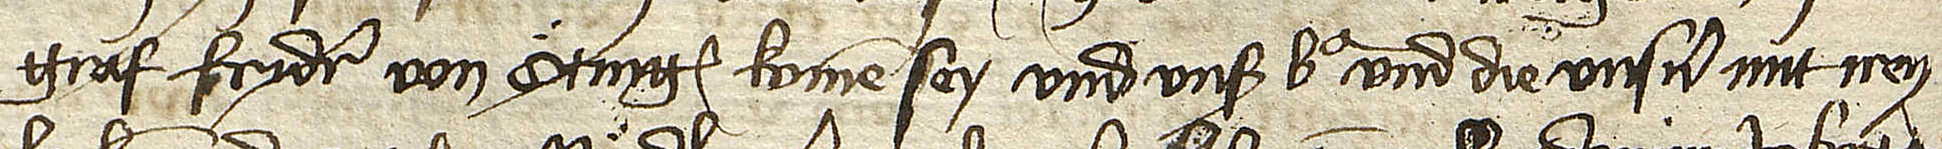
graf fridr* von Öting* kome* ſey vnd vnſ* b* vnd die vnſn* mit iren
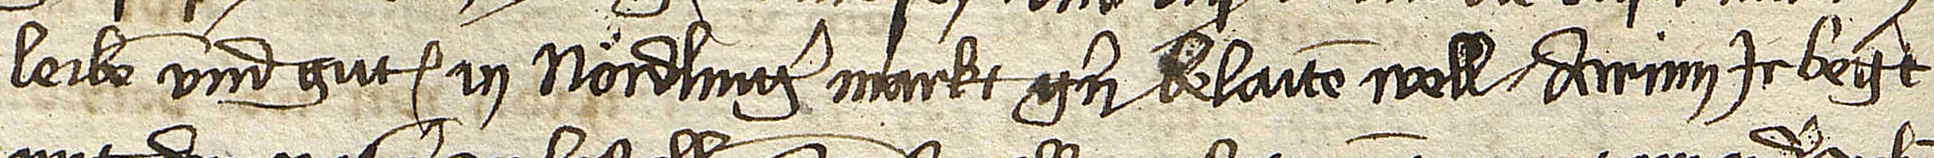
leibe* vnd gut* in Nördling* markt g*n belaite* well / darinn Ir beg*t
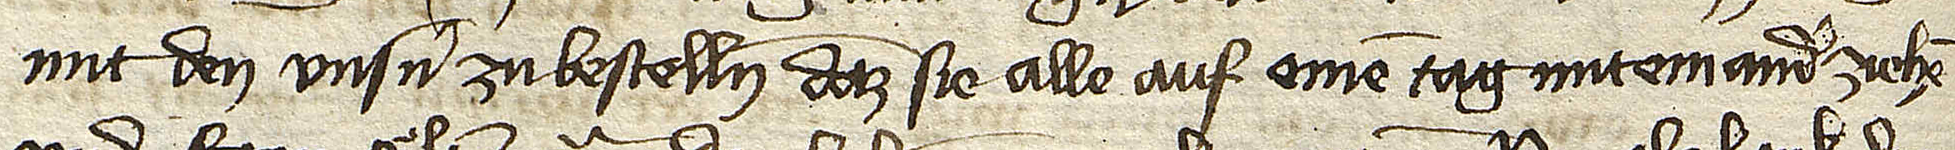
mit den vnſn* ʒu beſtelln* daʒ ſie alle auf eine* tag miteinand* ʒiehe*
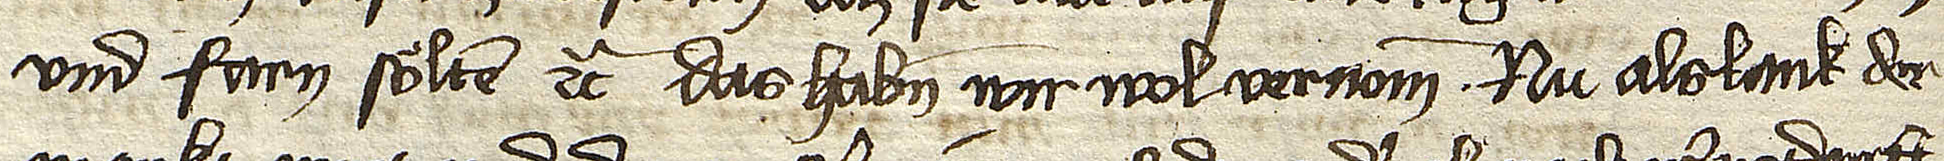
vnd farn ſölte* ec* das habn* wir wol vernom* . Nu als lank der
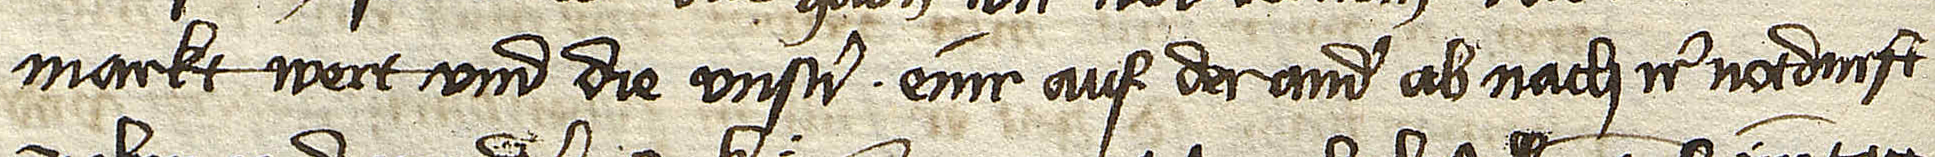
markt wert vnd die vnſn* . einr auf der and* ab nach ir* notdurft
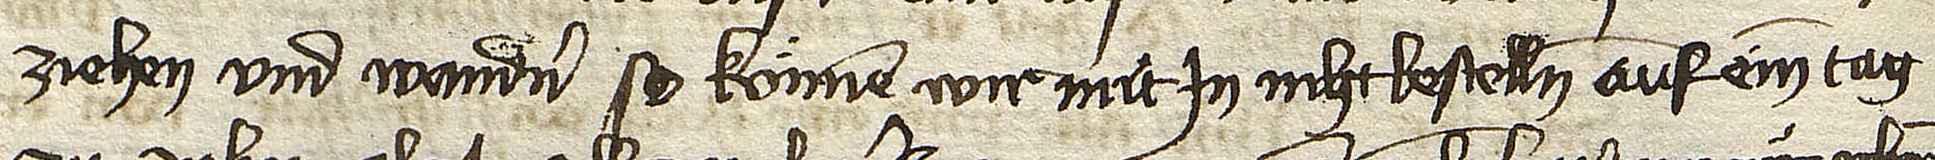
ʒiehen vnd wandn* ſo könne* wir mit In niht beſtelln* auf ein* tag
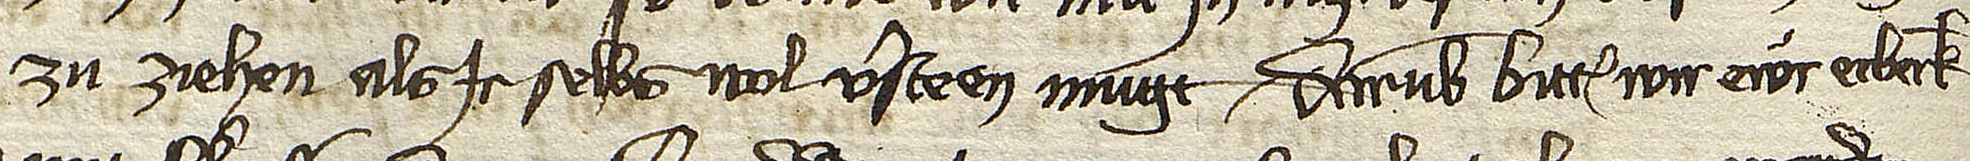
ʒu ʒiehen als Ir ſelbs wol v*ſteen mugt / Darub* bitt* wir eẅr erberk*
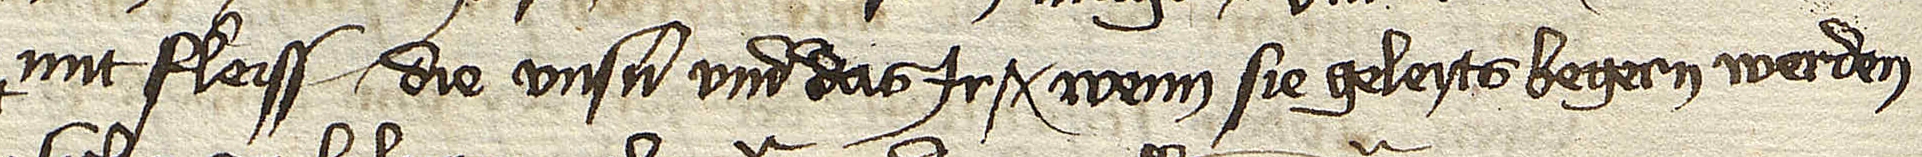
mit fleiſſ / die vnſn* vnd das Ir wenn ſie geleyts begern werden
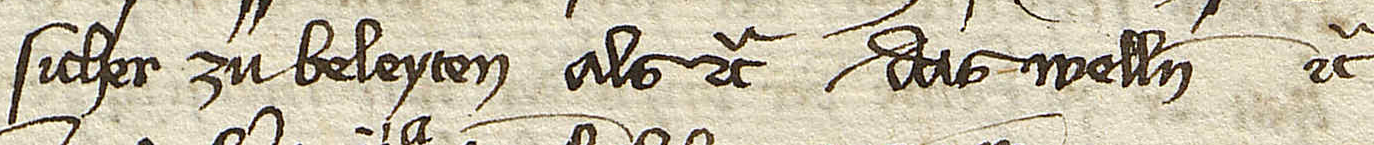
ſicher ʒu beleyten / als ec* / das welln* ec*
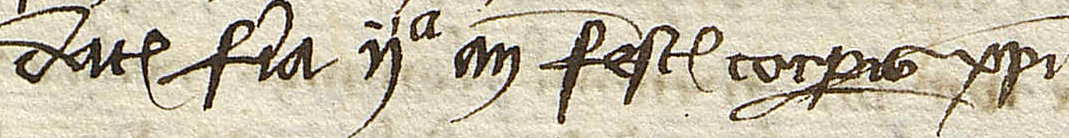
Dat* fi*a ii* an* feſt* corpis* xpi*
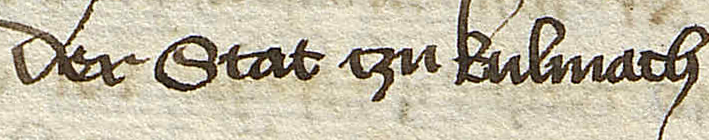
Der Stat cʒu Kulmach
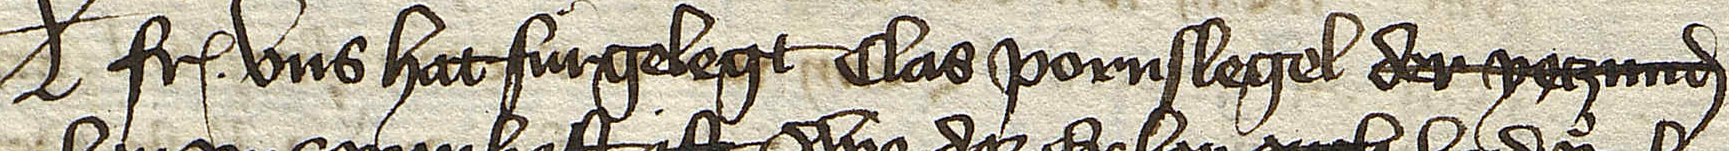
L* fr* . Vns hat fürgelegt Clas Pornſlegel der yecʒund*
